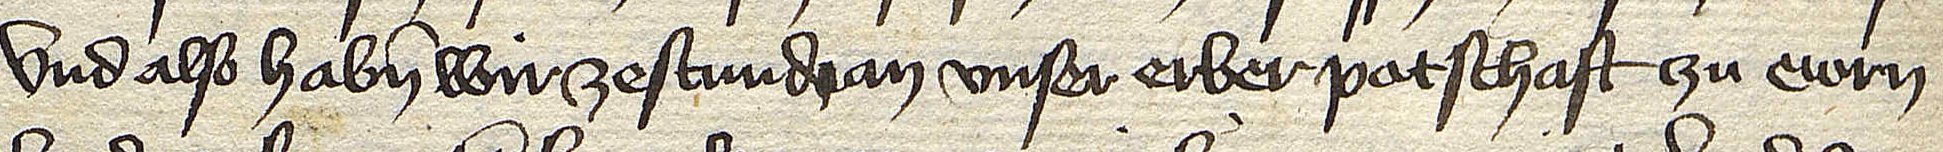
vnd alſo habn* wir cʒeſtundan vnſer erber potſchaft cʒu ewrn
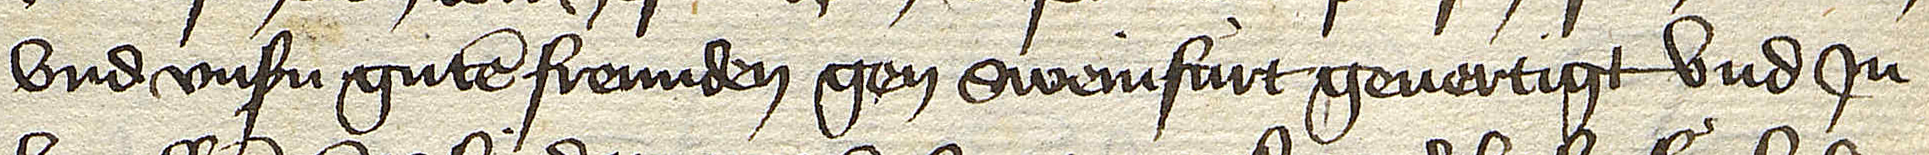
vnd vnſ*n gute* freunden gen Sweinfürt geuertigt vnd In
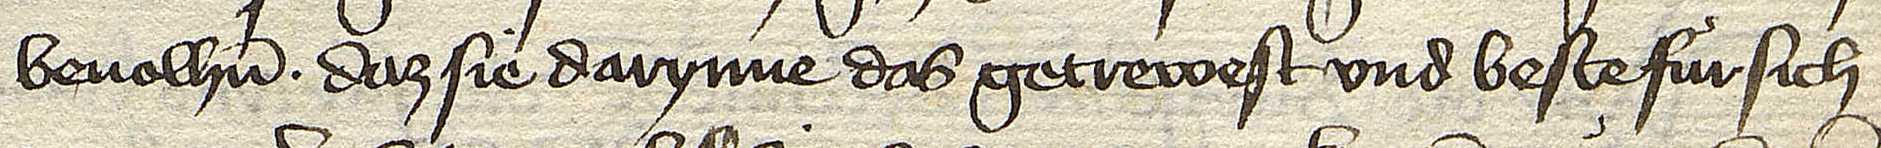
beuolhn* . daʒ ſie darynne das getreweſt vnd beſte für ſich
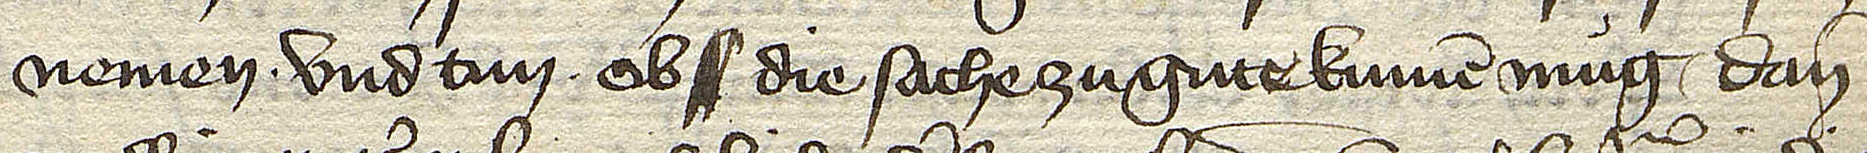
nemen . vnd tun . Ob ſ die ſache cʒu gute kume* müg / dan*
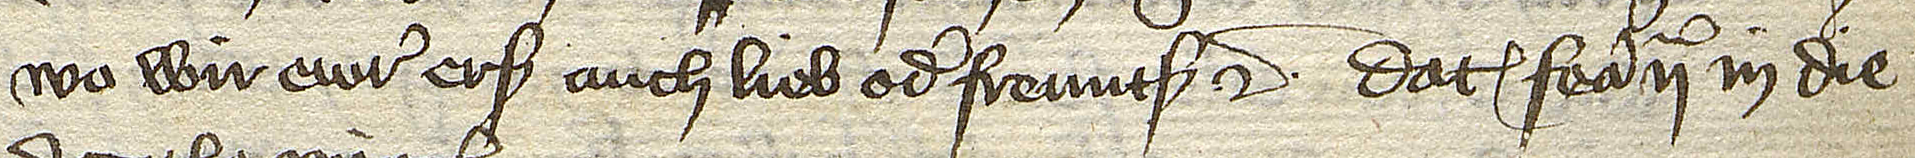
wo wir ewr* erſ* auch lieb od* freuntſ* ec* . dat* fea* ii* in die
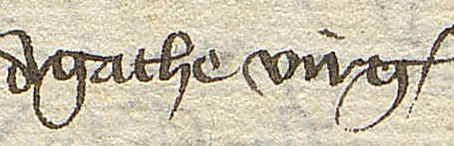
Agathe virg*
